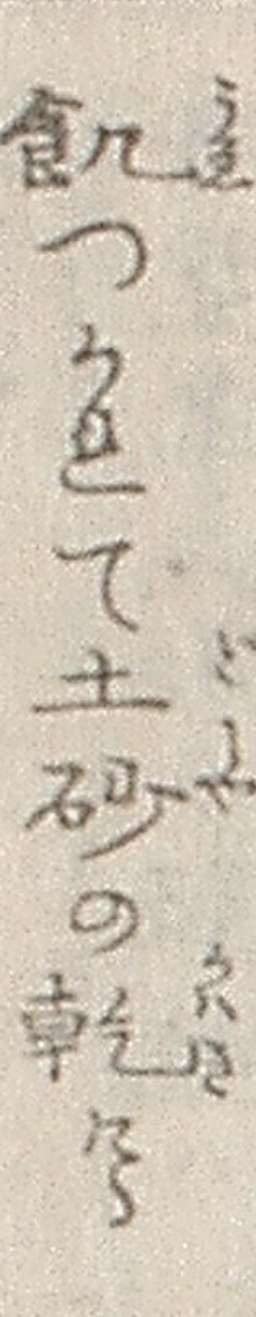飢つかれて土砂の乾ける
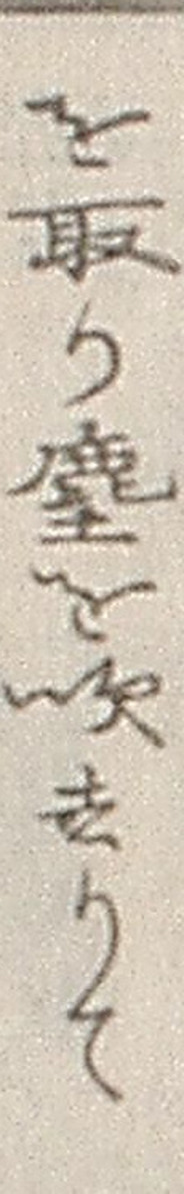を取り塵を吹去りて
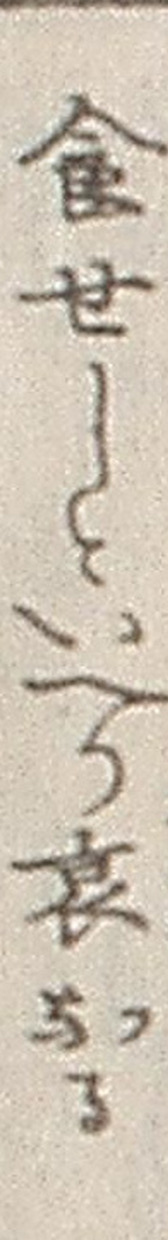食せしといへり哀なる
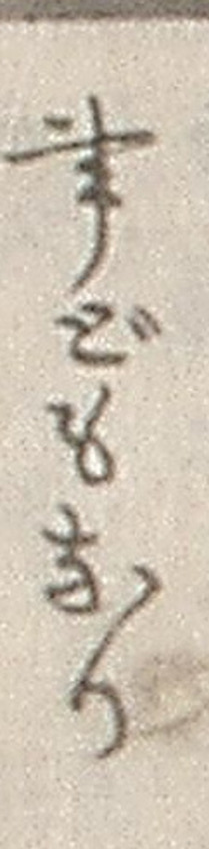事どもなり

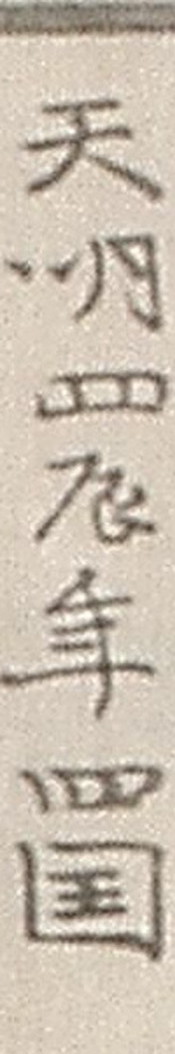天明四辰年四国
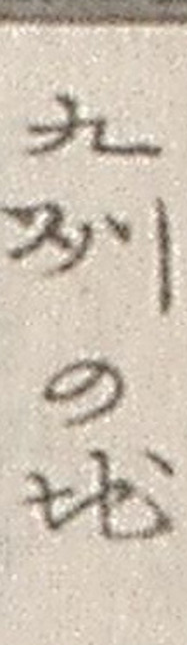九州の地
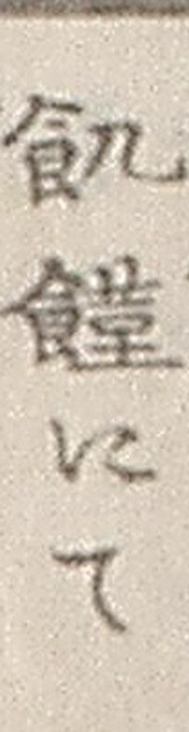飢饉にて
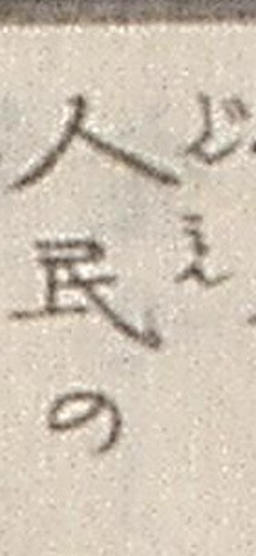人民の
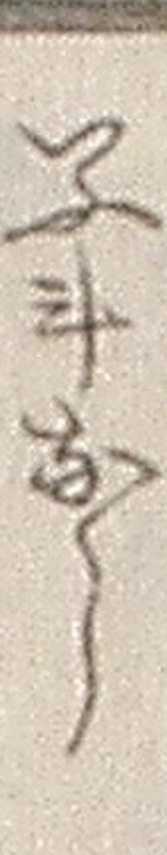いふ計なし
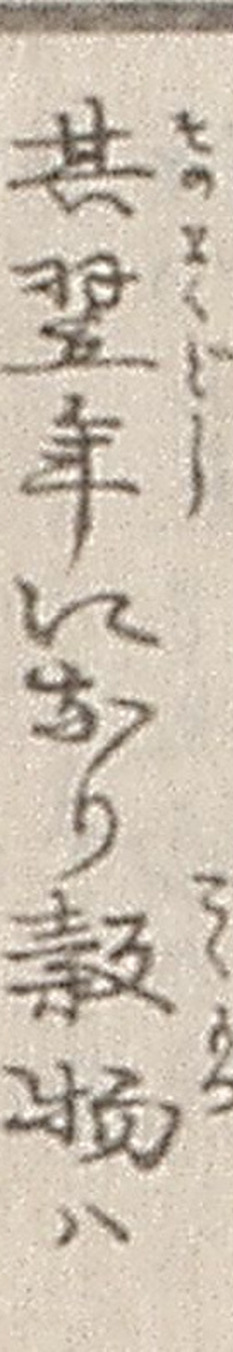其翌年になり穀物は
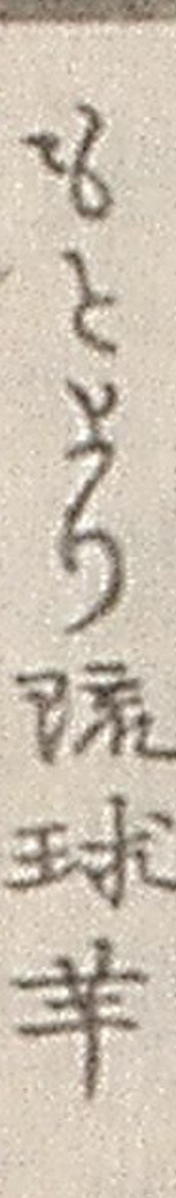もとより琉球芋
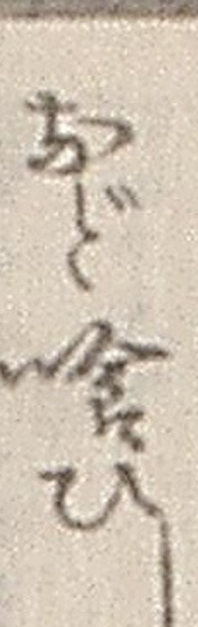など喰ひ
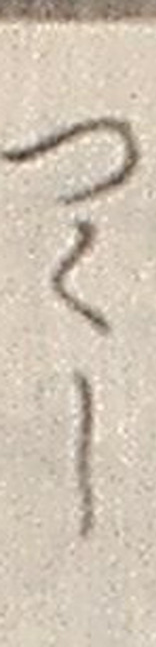つくし
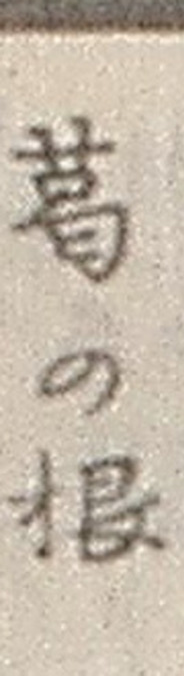葛の根
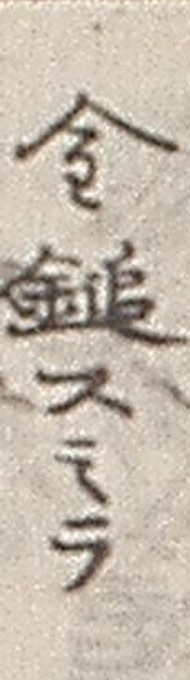金槌スミラ
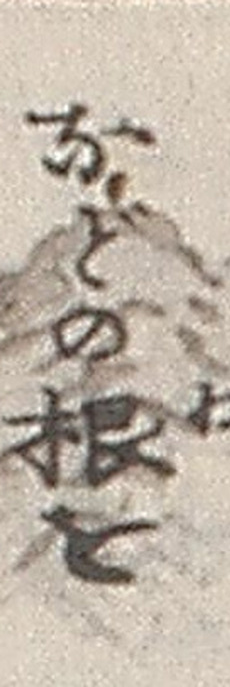などの根を
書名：凶荒図録　完
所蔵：東京大学地震研究所図書室 Earthquake Research Institute Library, The University of Tokyo, JAPAN
